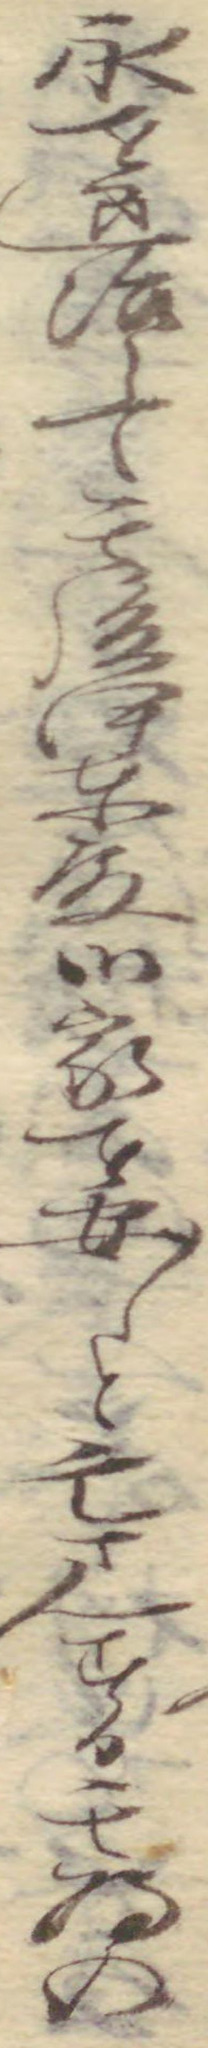永を退治して其後伊東殿御家を安々と亡さんする其為の
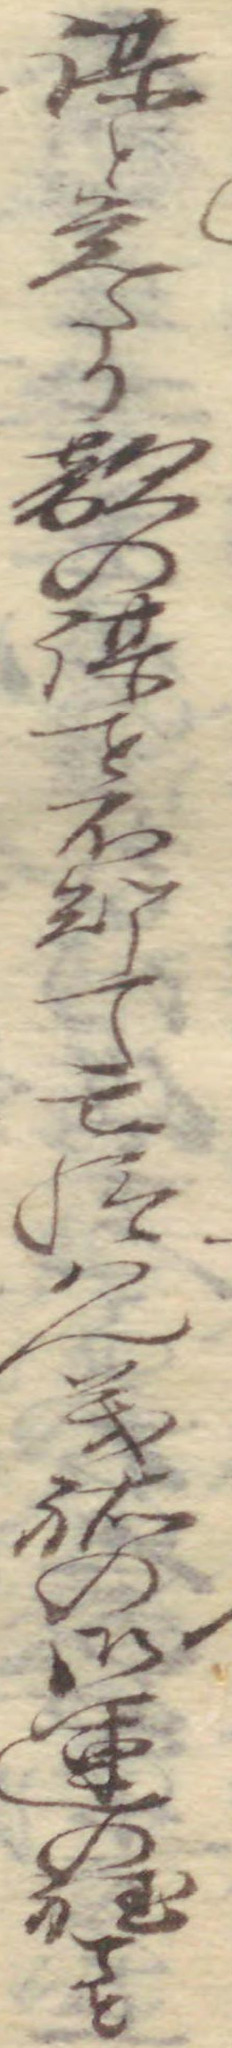謀と覚たり敵の謀を不知して亡給はん義祐の御運の程こそ
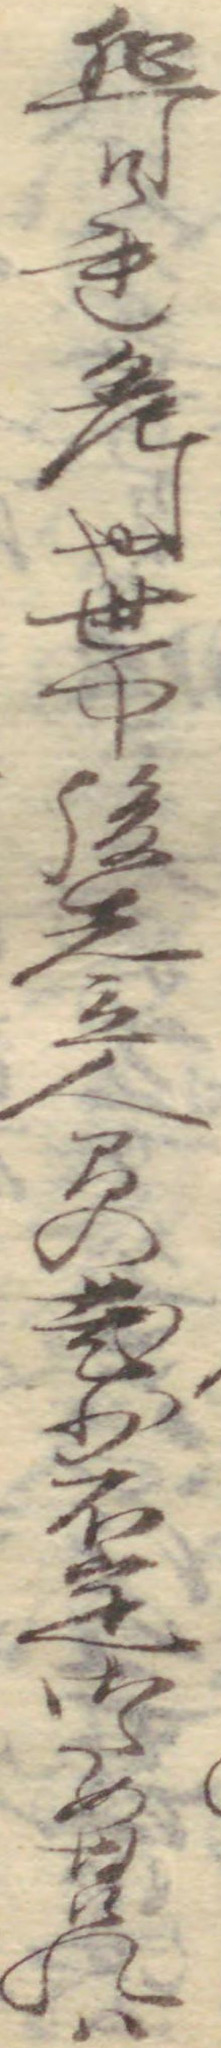然しけれ危しや世中後先立人間の老少不定さためなけれは
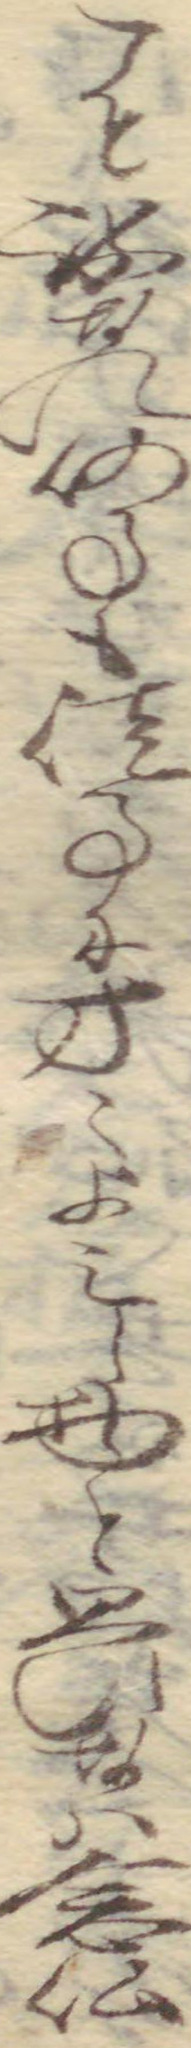こそ誠なれ何事も徒事に方々よみし物と思ひなは念仏
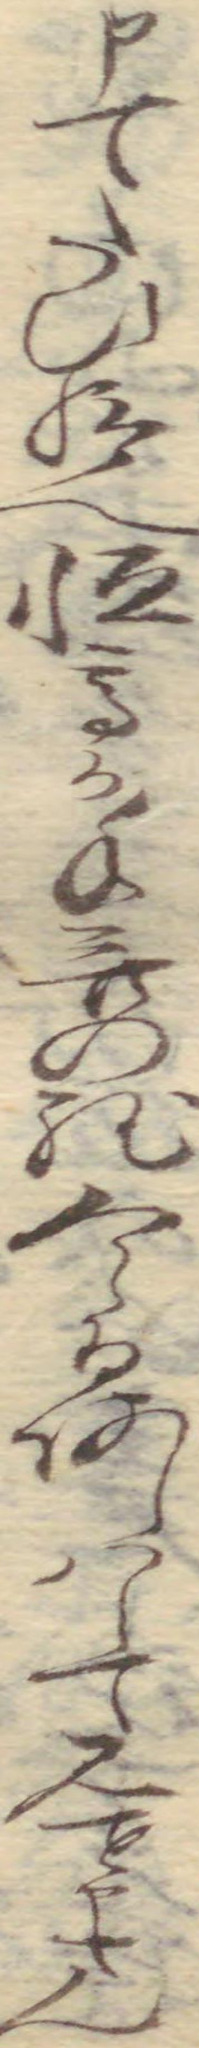申てたひ給へ恒高か手并の程今日あらはして見せ申さん
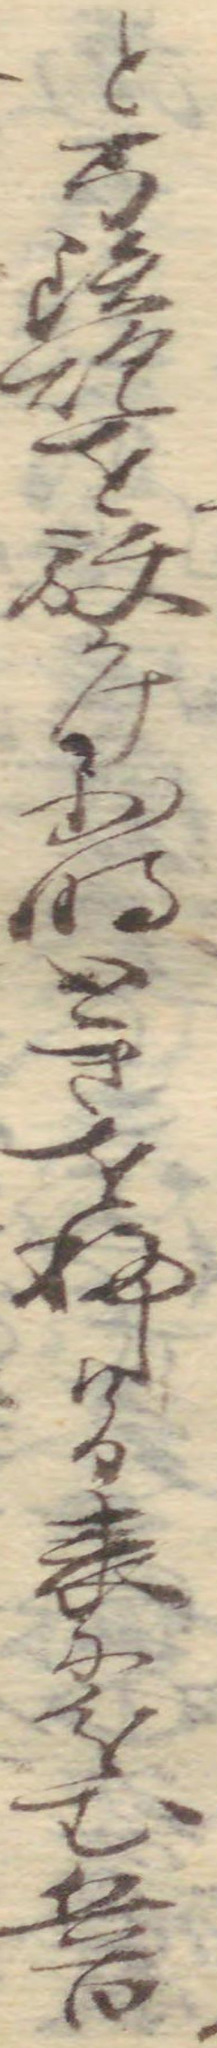と弓鉄砲を放かけ少時ときを移しける表に進む兵百
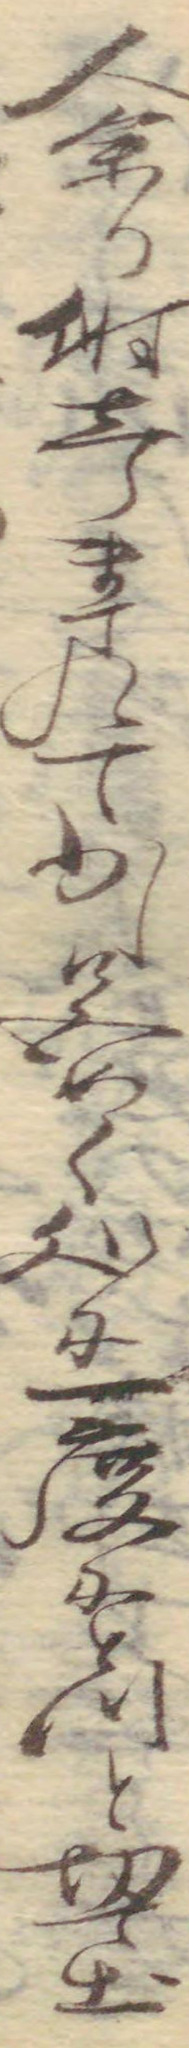人余り射しらまされて少し色めく処に一度にとつと切て出
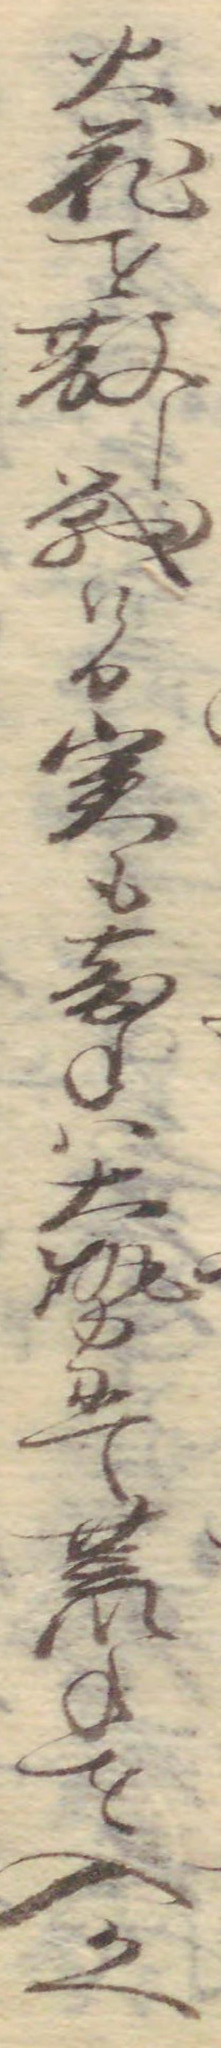火花を散し戦ける実も寄手は大勢にて荒手を入かへ
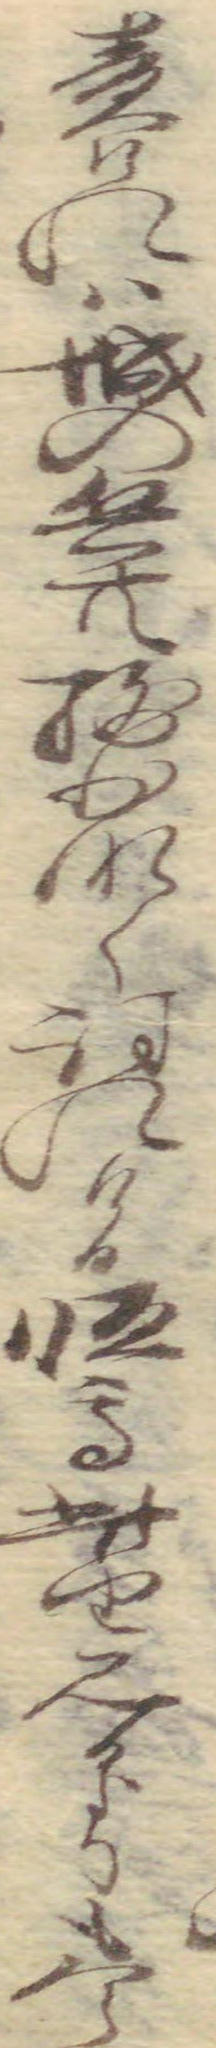責けれは城の兵共残少なく討れける恒高此由見るよりも今
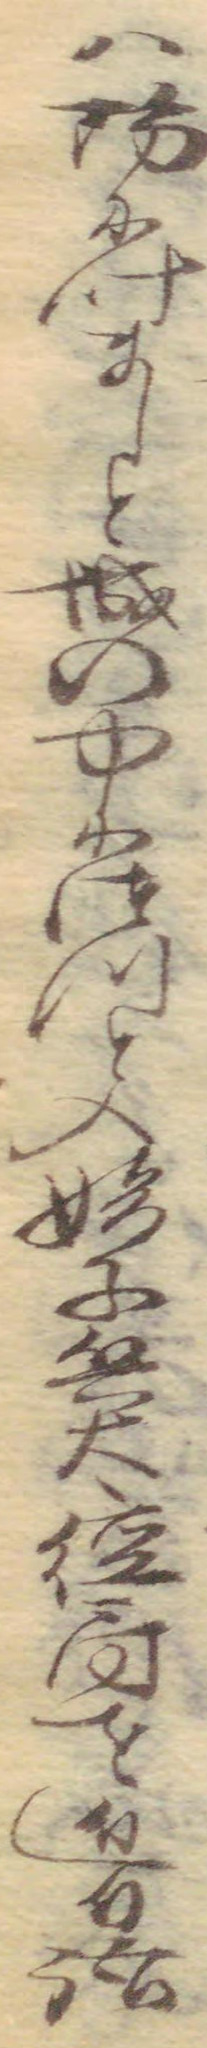は防に叶ましと城の中につつと入嫡子兵太経房を近付

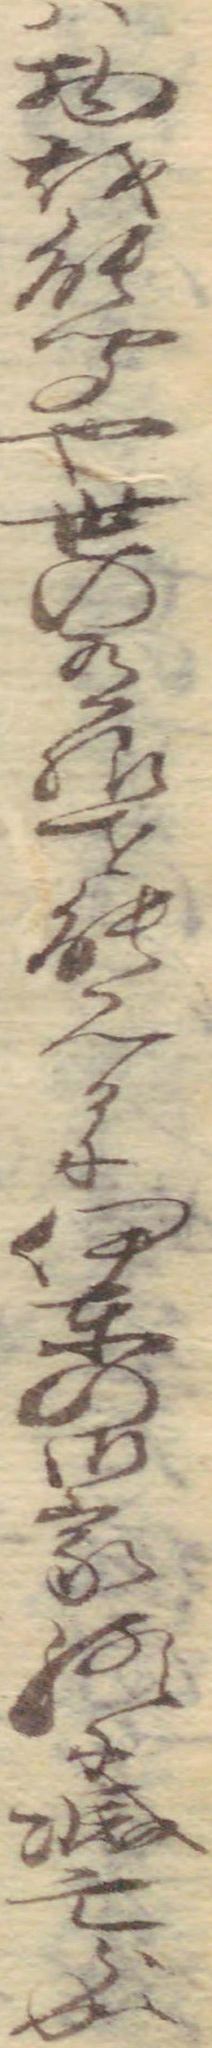は物を能聞や世の有様能見るに伊東の御家終に滅亡被成
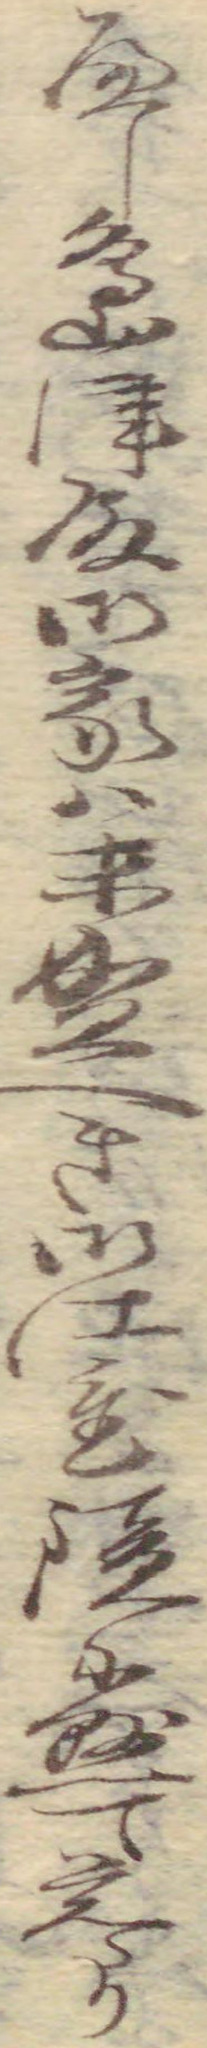へし嶋津殿御家は末盛へき御仕置鏡に懸て覚たり
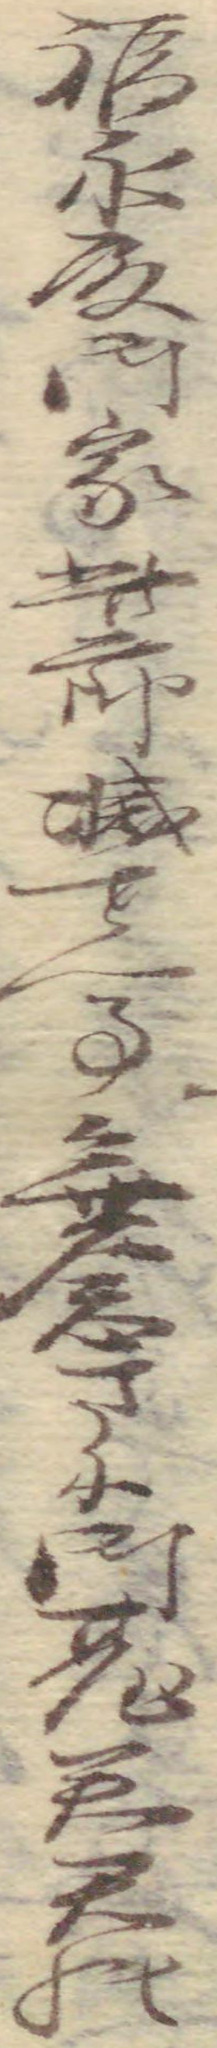福永殿御家此節滅せん事無念さに御台若君の
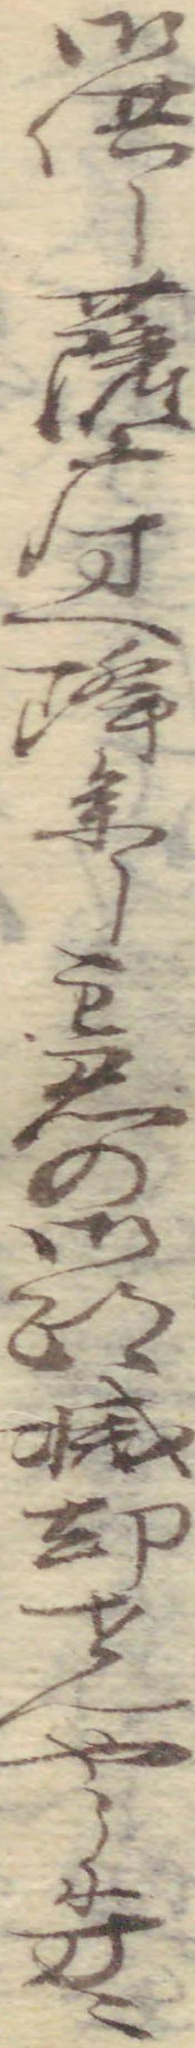御供し薩摩方へ降参し主君の御跡滅却せんやうに方々
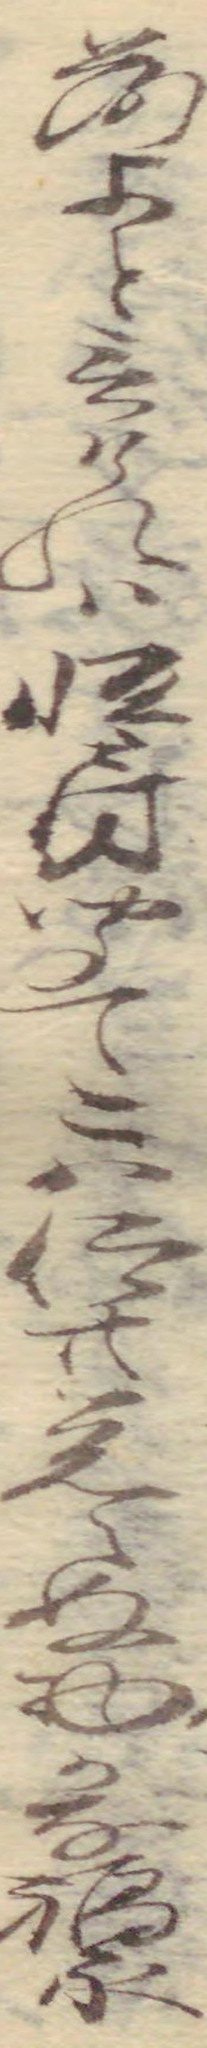落よと言けれは恒房聞てこは仰共覚えぬ物かな福永
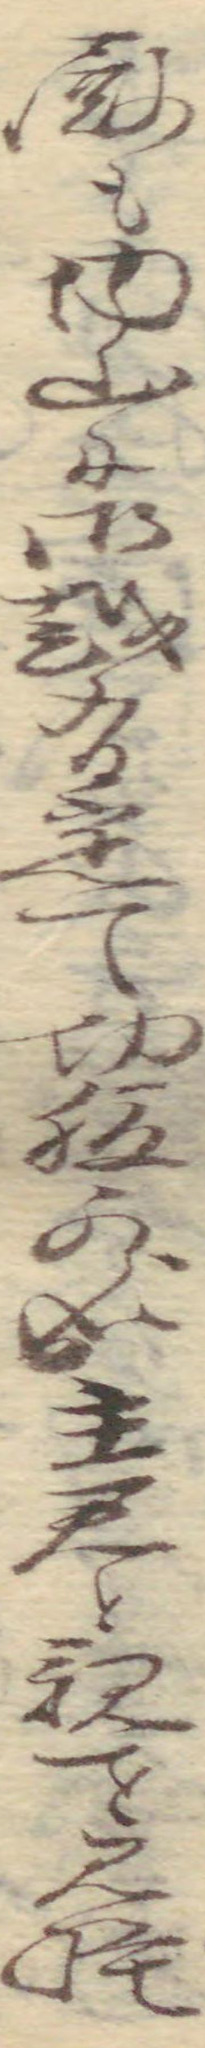殿も内山に御越有定て切腹可被成主君と親を見捨
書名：鶯宿雑記. 巻199-200
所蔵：国立国会図書館 National Diet Library, JAPAN
